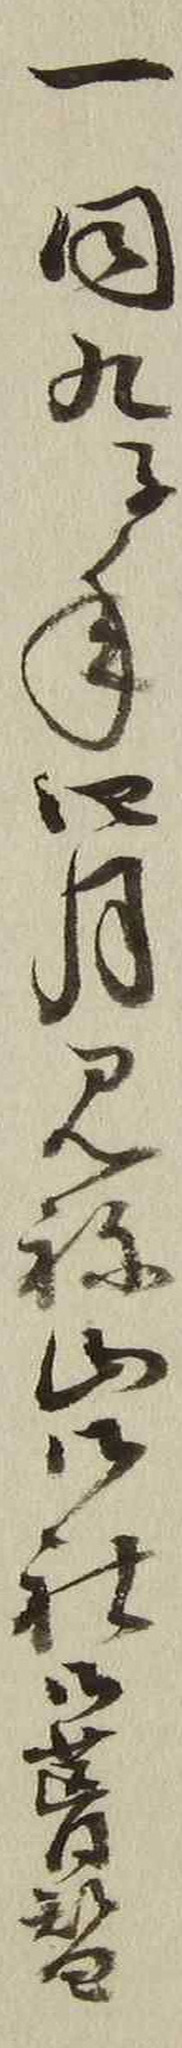一同九子年四月見禰山御社御葺替
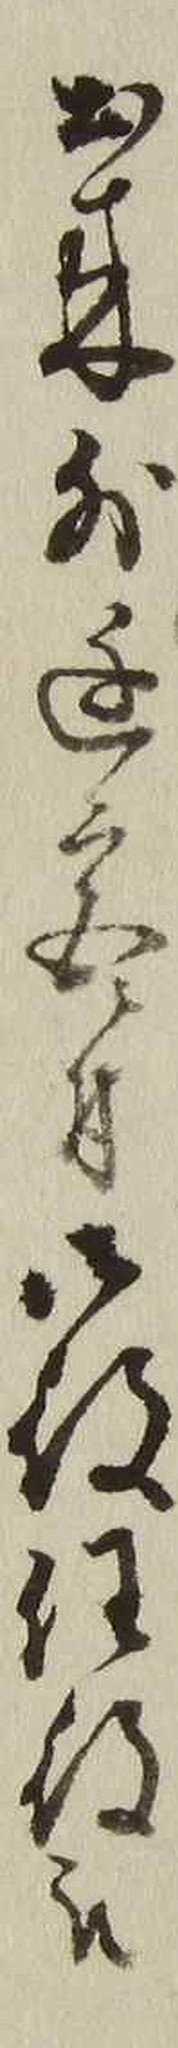出来外遷宮ニ付御役任役被
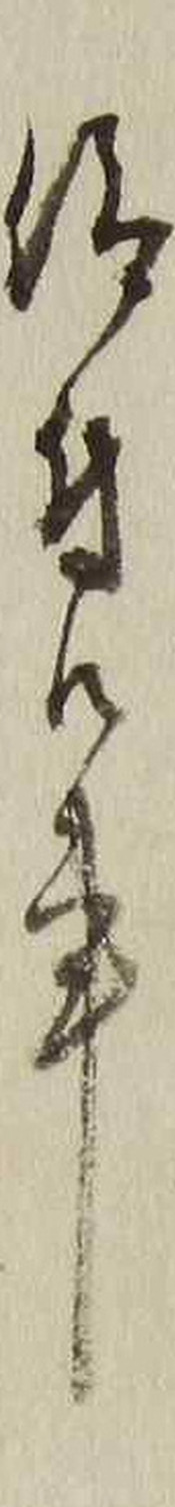仰付候事
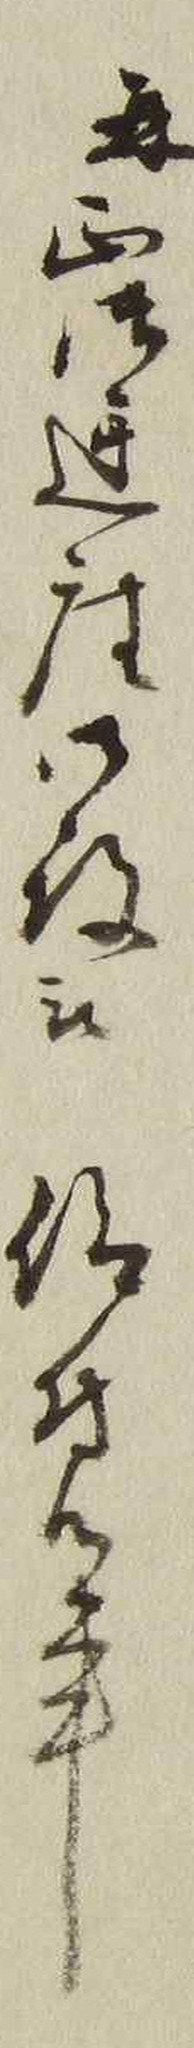并正御遷座御役被仰付候事
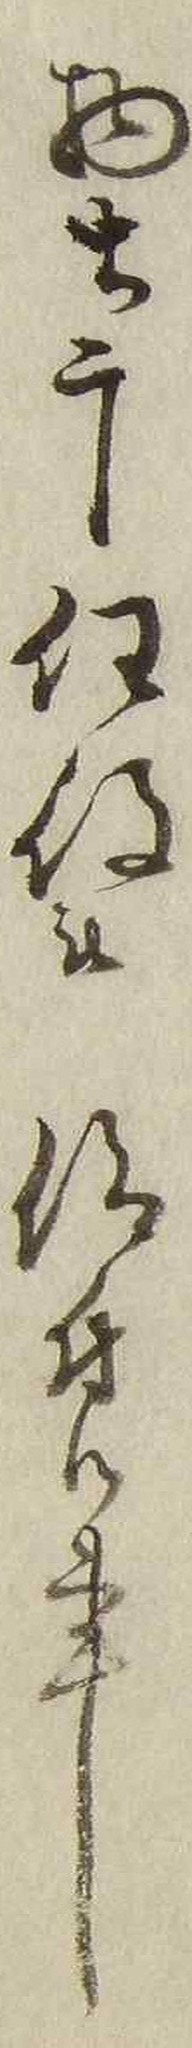物虫干任役被仰付候事役
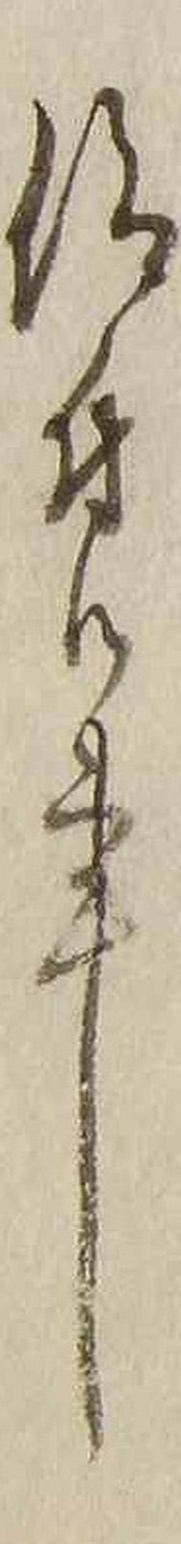仰付候事

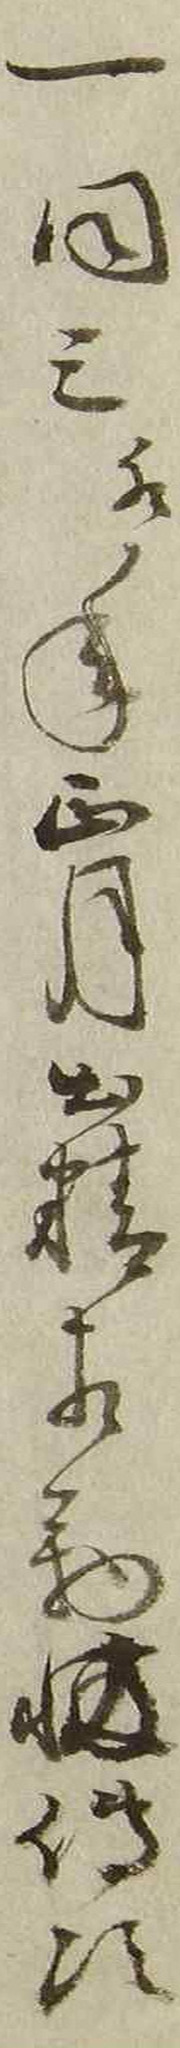一同三卯年正月精出相勤忰伝次
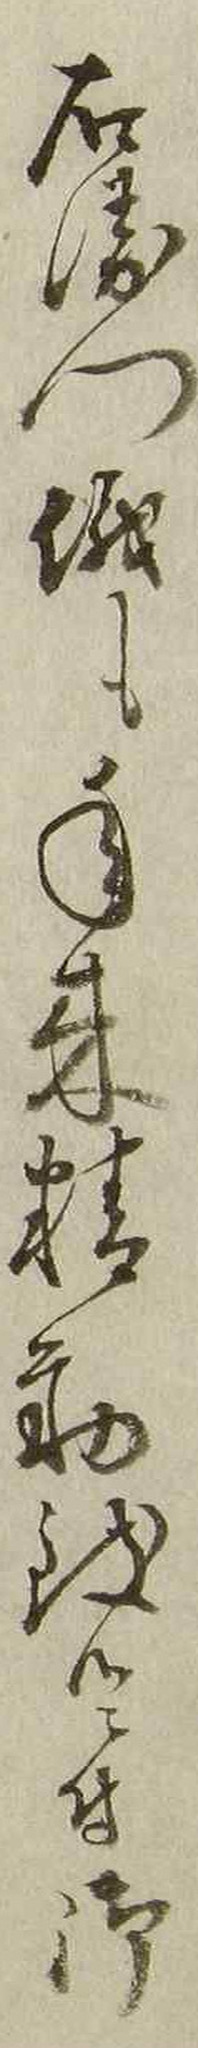右衛門儀も年来精勤致候ニ付御
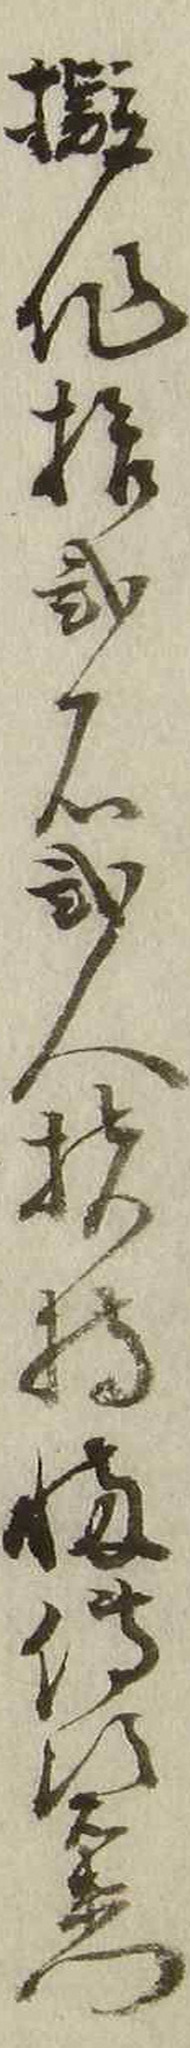擬作拾弐石弐人扶持忰伝次右衛門
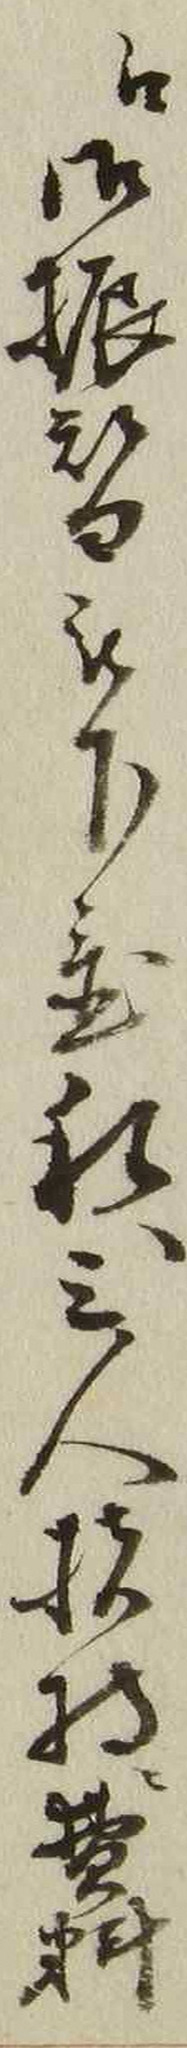江御振替被下置私へ三人扶持ニ費料
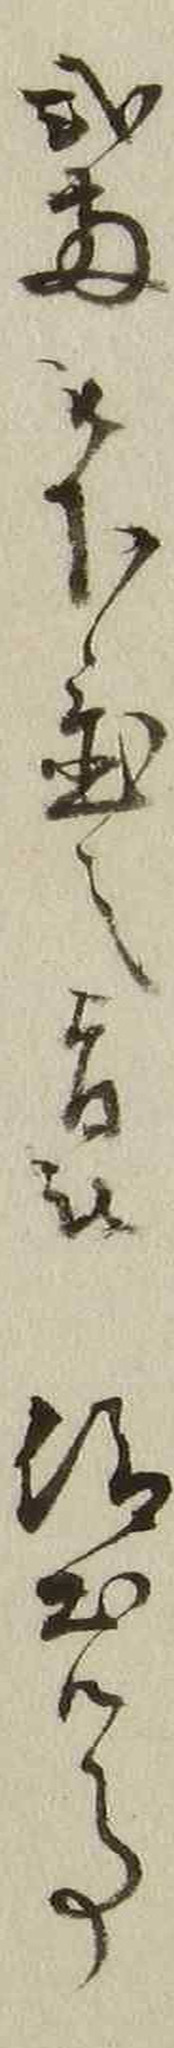弐両被下置之旨被仰出候事
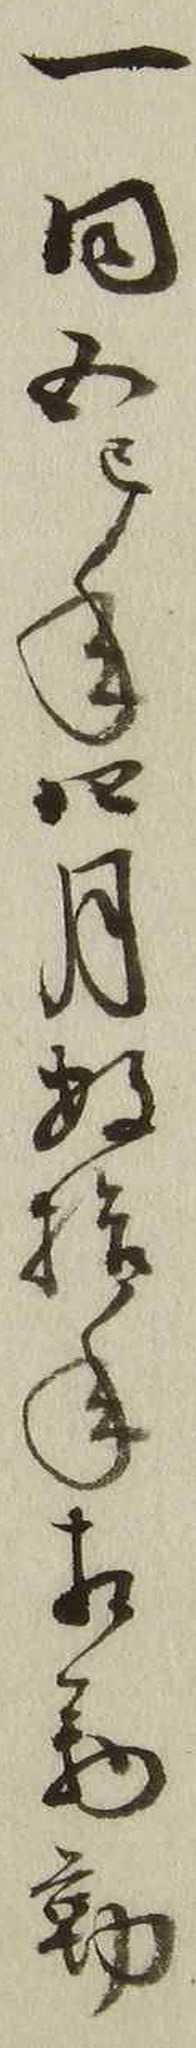一同五巳年四月数拾年相勤勤
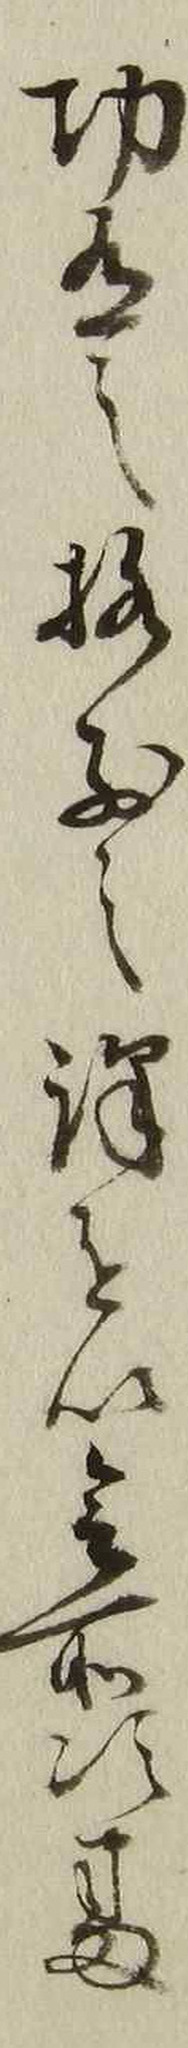功有之格別之訳を以会所次番
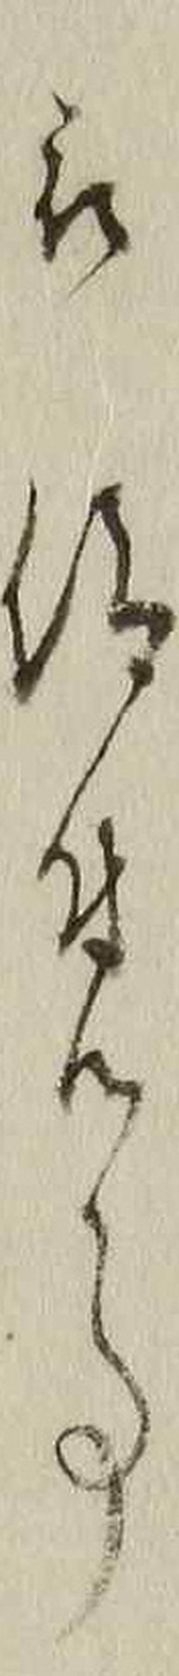被仰付候事
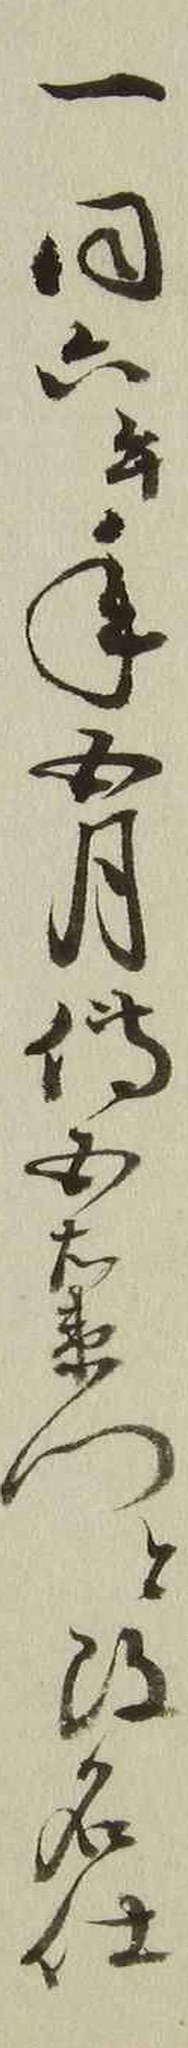一同六午年五月伝五右衛門と改名仕
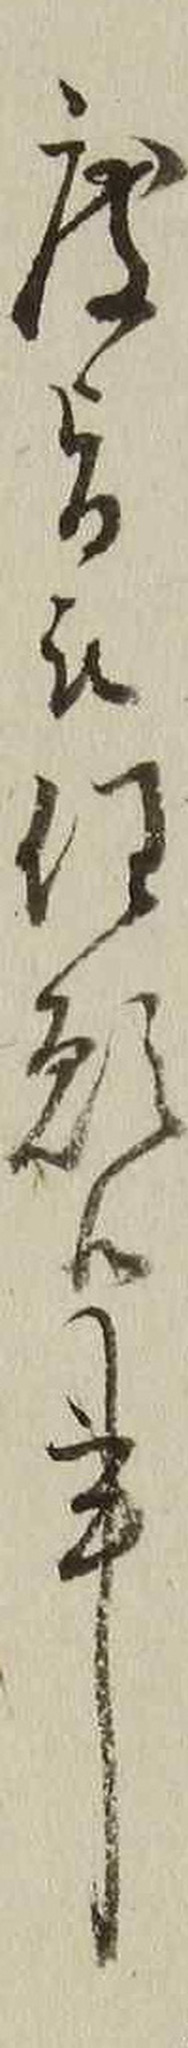度旨被任願候事
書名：諸士系譜　巻之39　は之部7
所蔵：会津若松市立会津図書館
